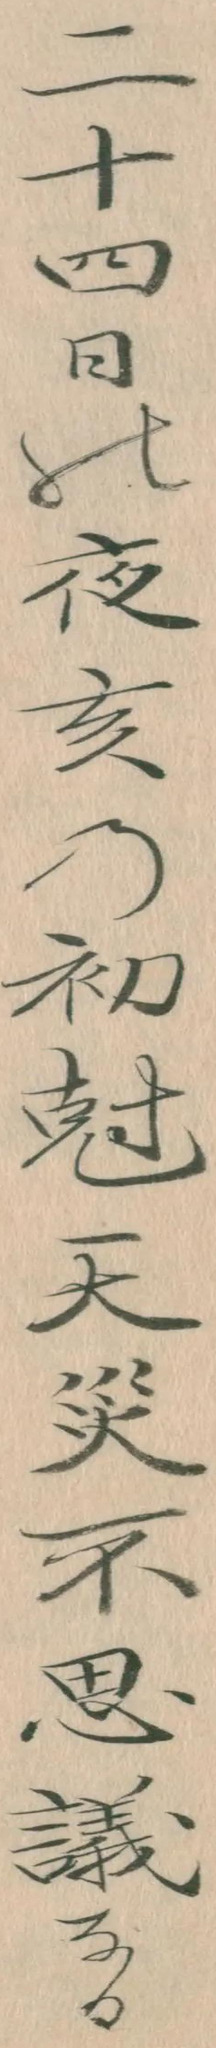二十四日の夜亥の初尅天災不思議なる
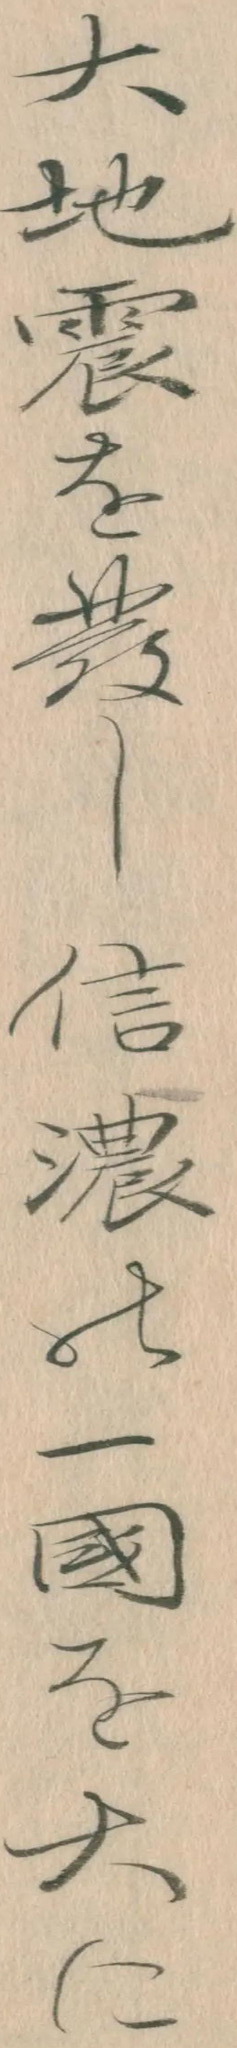大地震を発し信濃の一国を大に
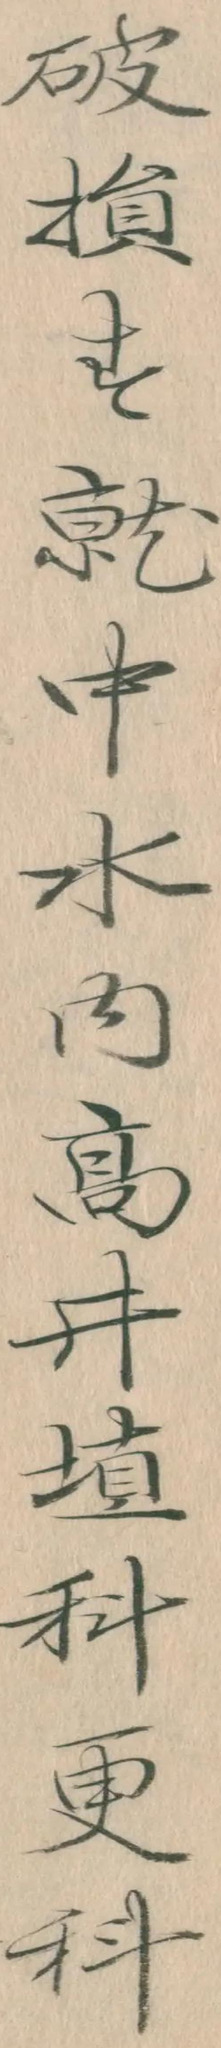破損す就中水内高井埴科更科
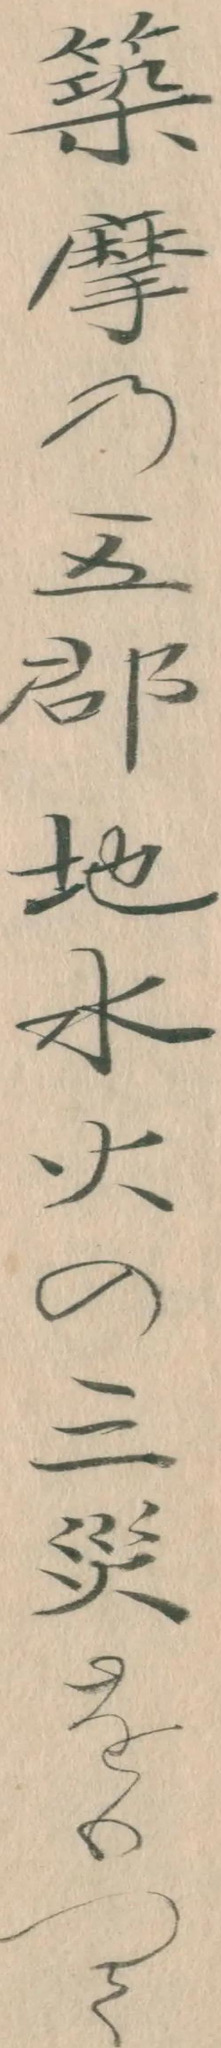筑摩の五郡地水火の三災をもつて
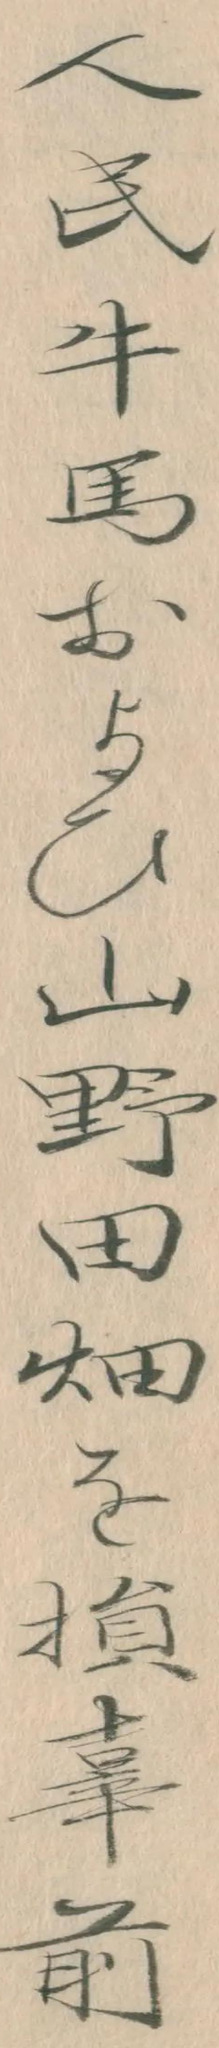人民牛馬およひ山野田畑を損事前
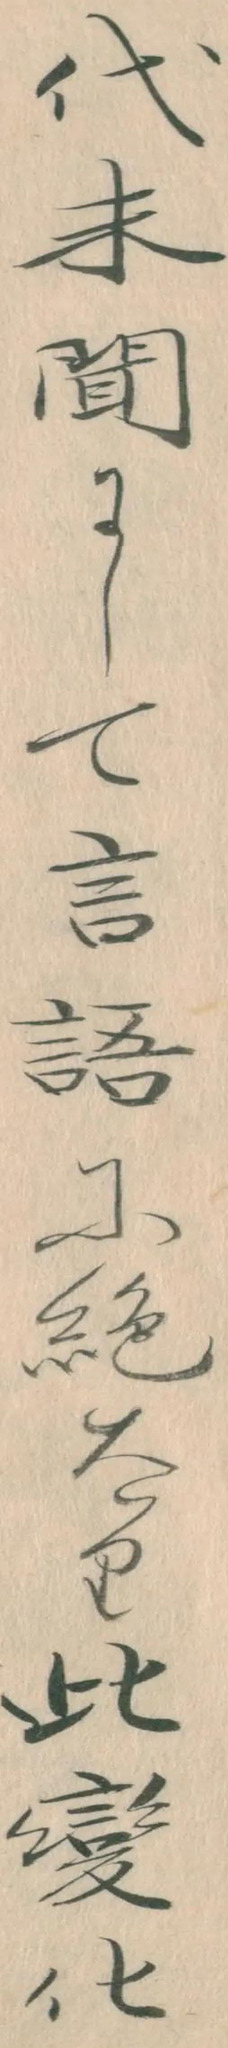代未聞にして言語に絶たり此変化
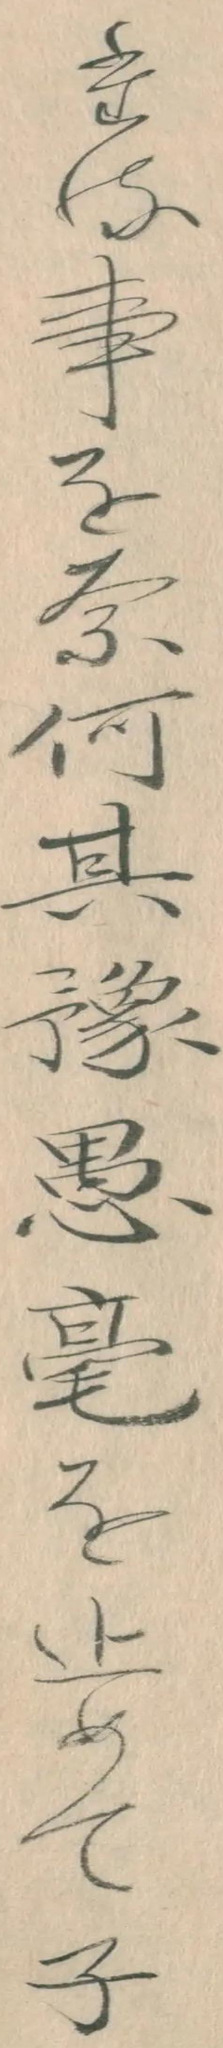たる事を奈何其予愚毫を止めて子

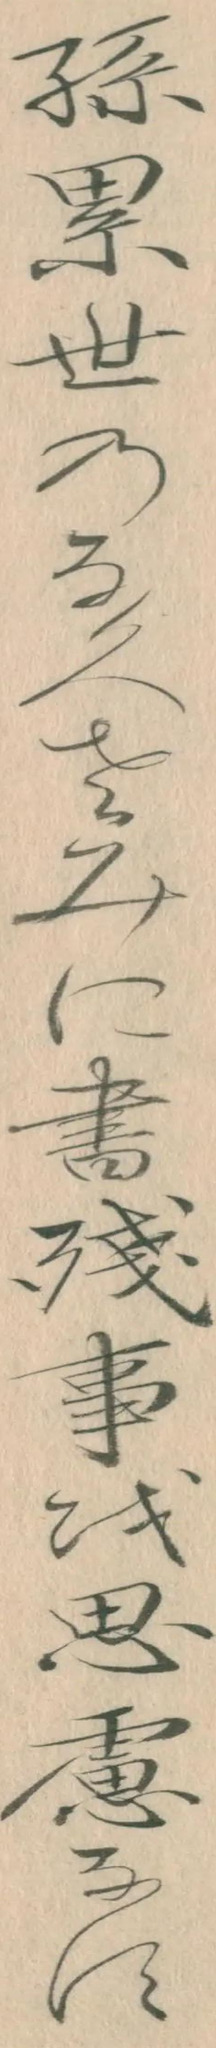孫累世のなくさみに書残事を思慮なす
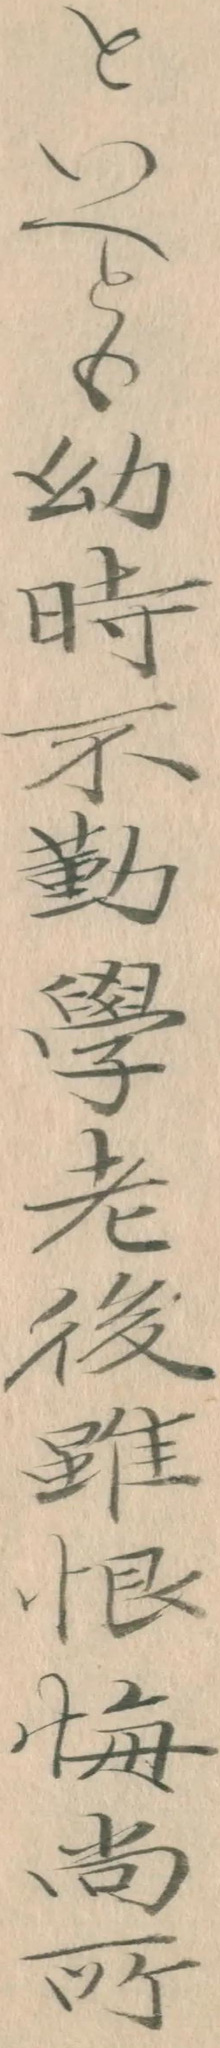といへとも幼時不勤学老後雖恨悔尚所
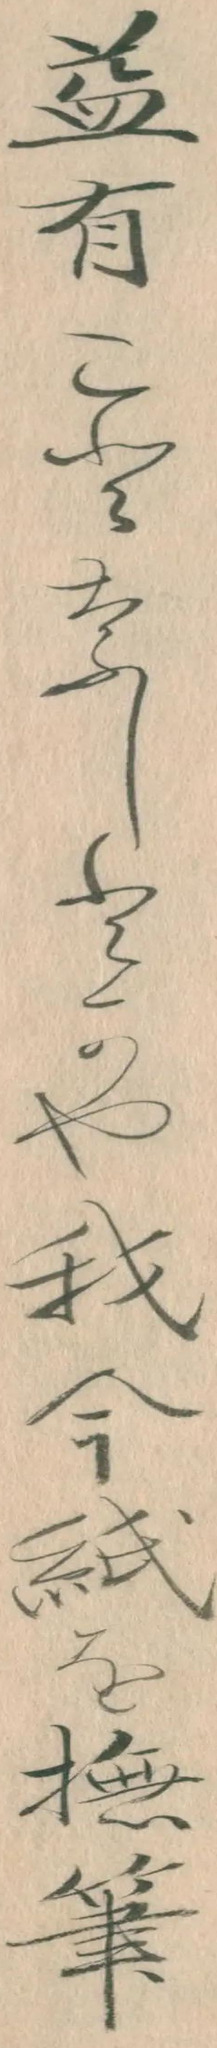益有ことなしとかや我今紙を撫筆
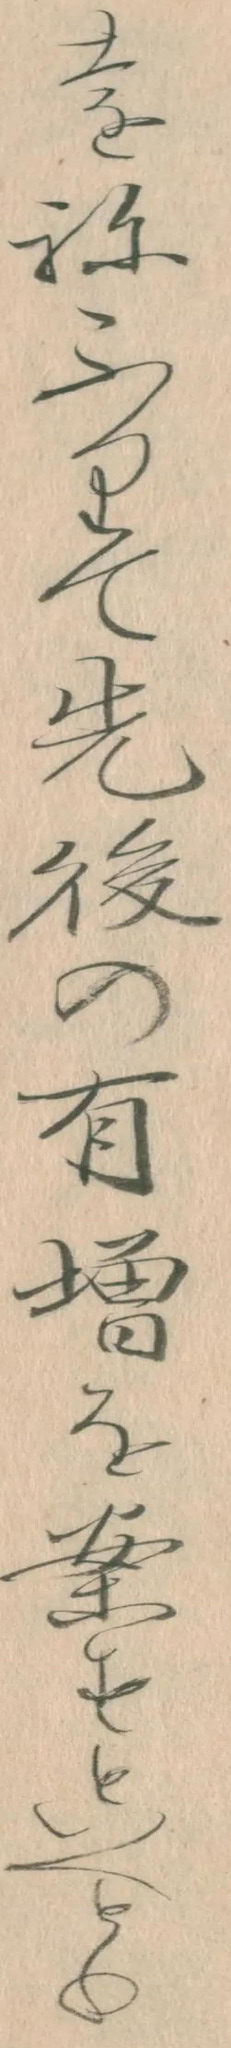をねふりて先後の有増を案すといへとも
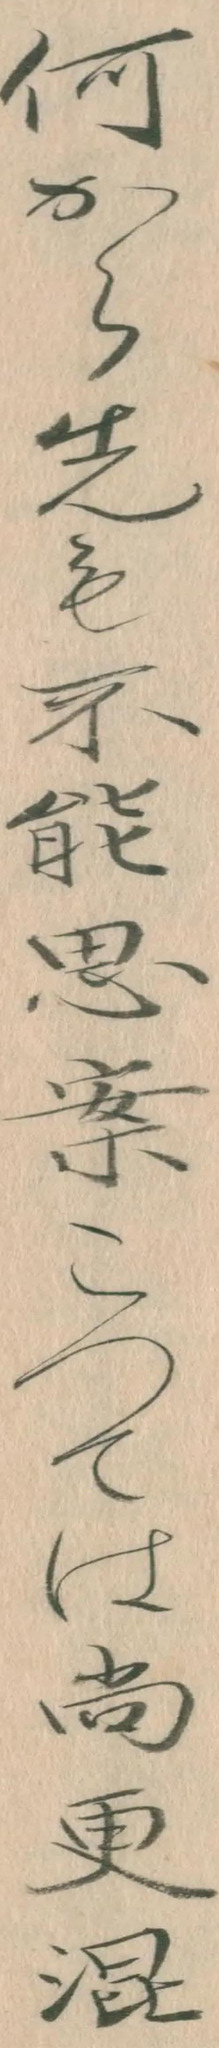何から先も不能思案こつては尚更混
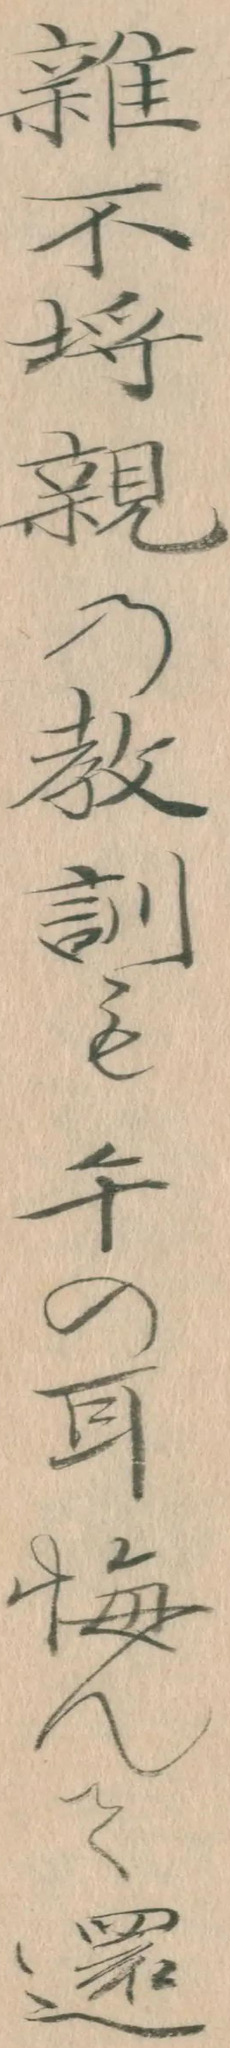雑不埒親の教訓を午の耳悔んて還
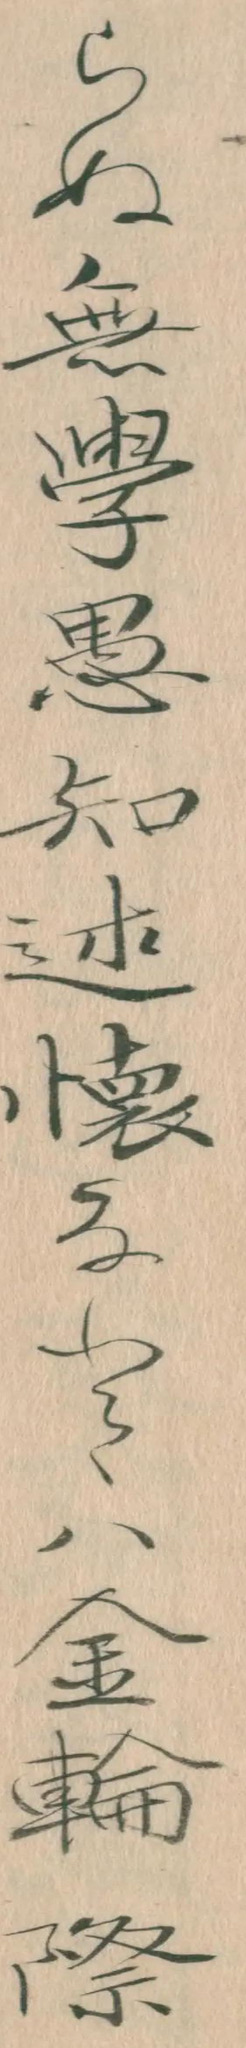らぬ無学愚知述懐なとゝは金輪際
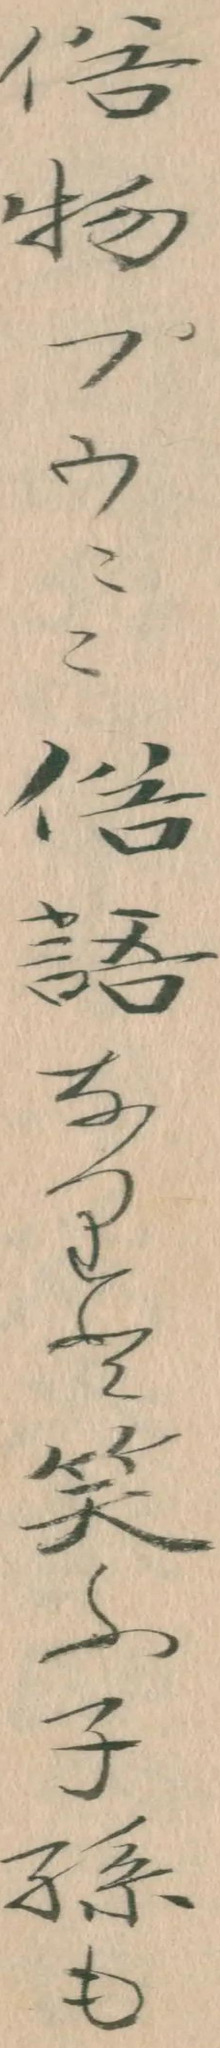俗物プウヽヽ俗語なりと笑ふ子孫も
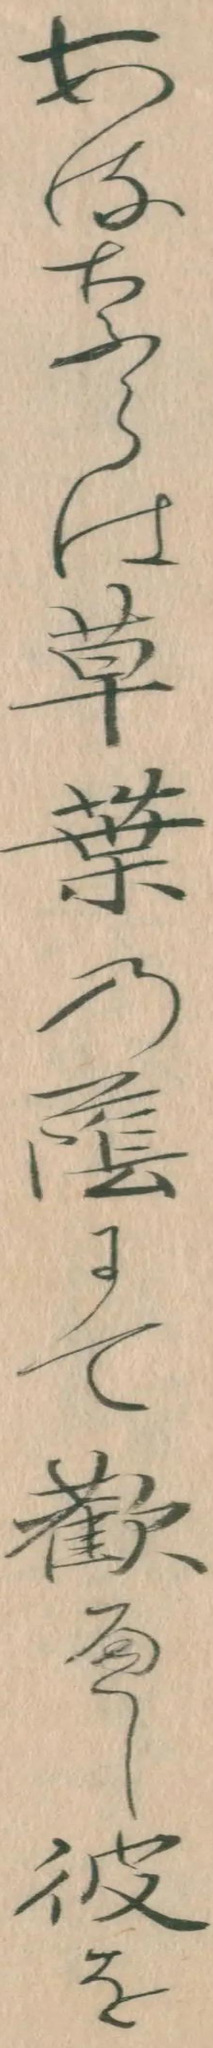あるならは草葉の蔭にて歓へし彼を
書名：俗語之種. [1]
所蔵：国立国会図書館 National Diet Library, JAPAN
